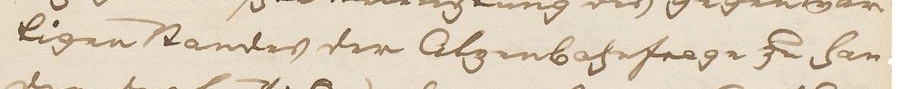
tigen Standes der Alpenbahnfrage zu Han-
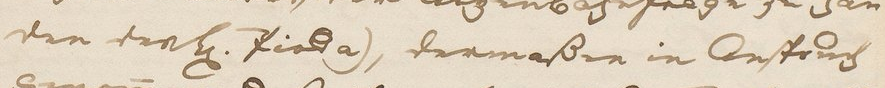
den des H. Pioda), dermaßen in Anspruch
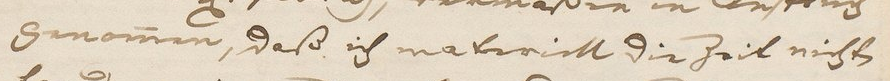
genommen, daß ich materiell die Zeit nicht
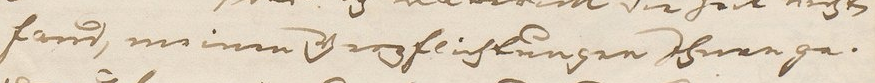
fand, meinen Verpflichtungen Ihnen ge-
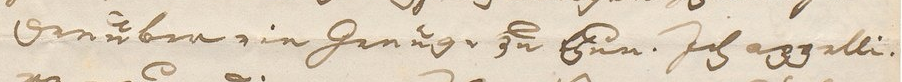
genüber ein Genüge zu thun. Ich appelli-
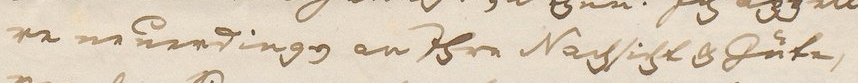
re neuerdings an Ihre Nachsicht & Güte,
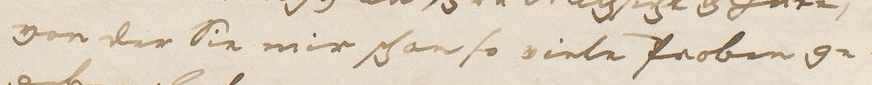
von der Sie mir schon so viele Proben ge-
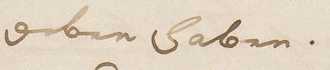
geben haben.
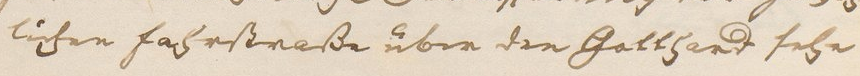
lichen Fahrstraße über den Gotthard sehe
